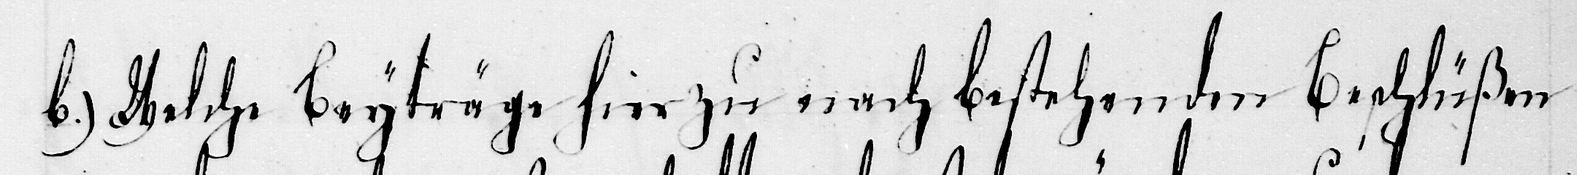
b.) Welche Beyträge hierzu nach bestehenden Beschlüßen
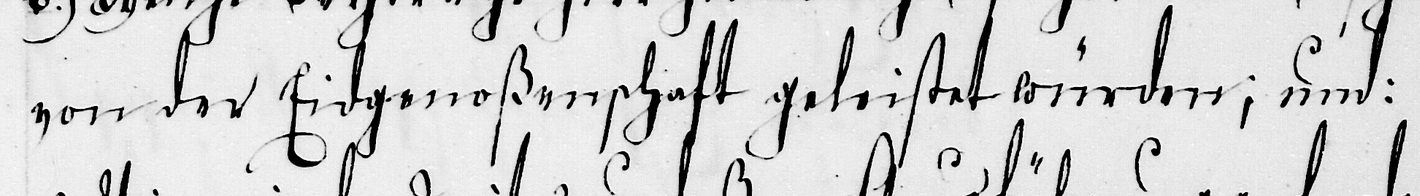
von der Eidgenoßenschaft geleistet würden; und:
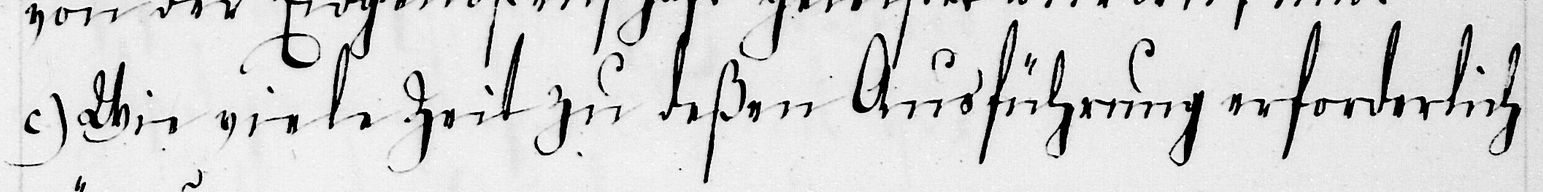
c.) Wie viele Zeit zu deßen Ausführung erforderlich
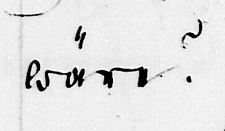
wäre?
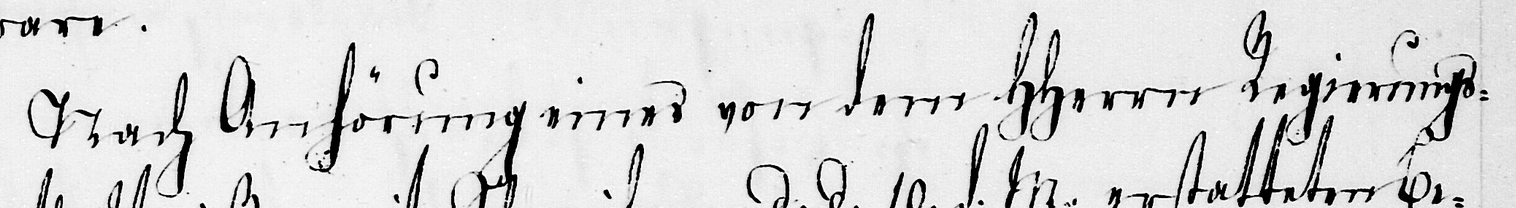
Nach Anhörung von dem Herrn Regierungs¬
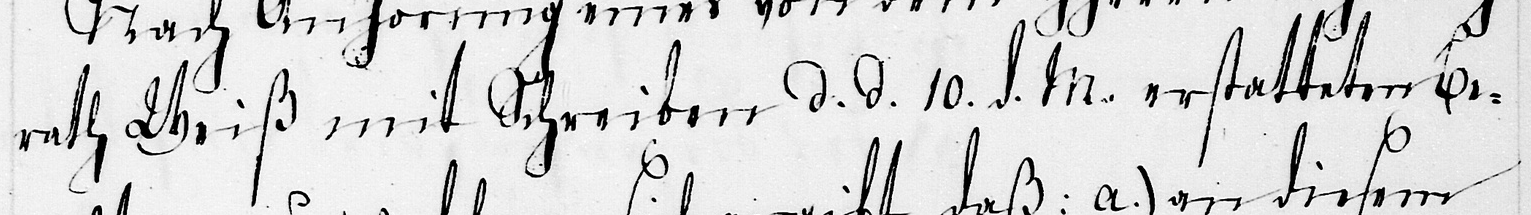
rath Weiß mit Schreiben d. d. 10. d. M. erstatteten Be¬
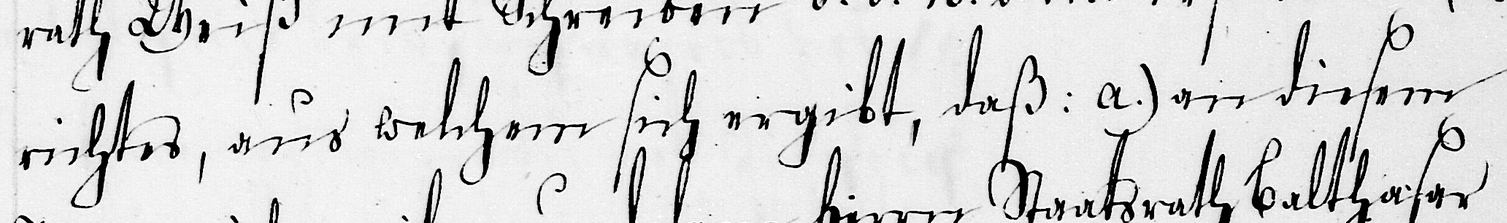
richtes, aus welchem sich ergibt, daß: a.) an diesem
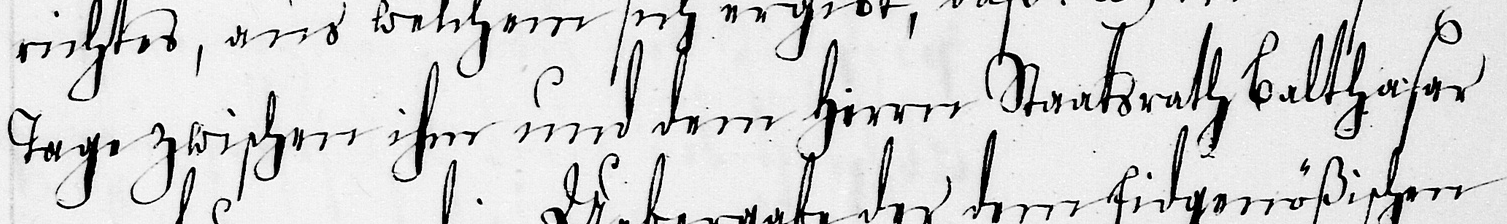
Tage zwischen ihm und dem Herrn Staatsrath Balthasar
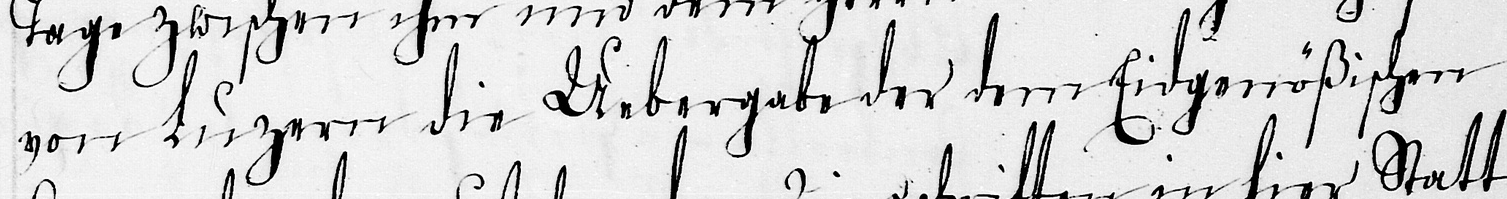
von Luzern die Uebergabe der dem Eidgenößischen
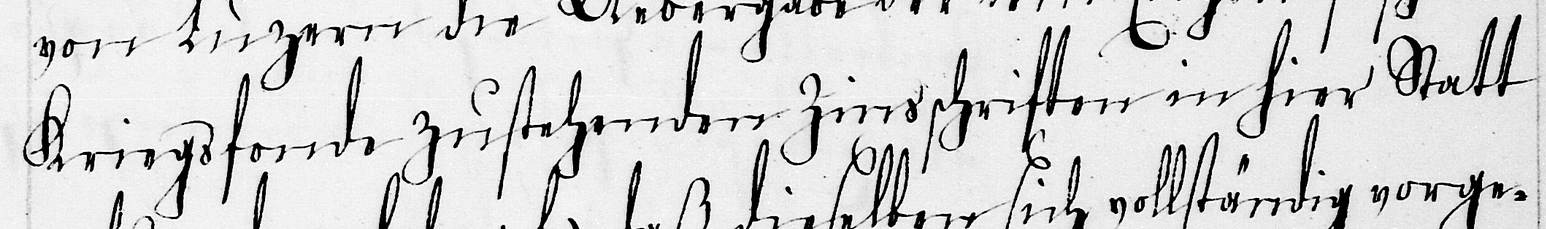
Kriegsfonde zustehenden Zinsschriften in hier Statt
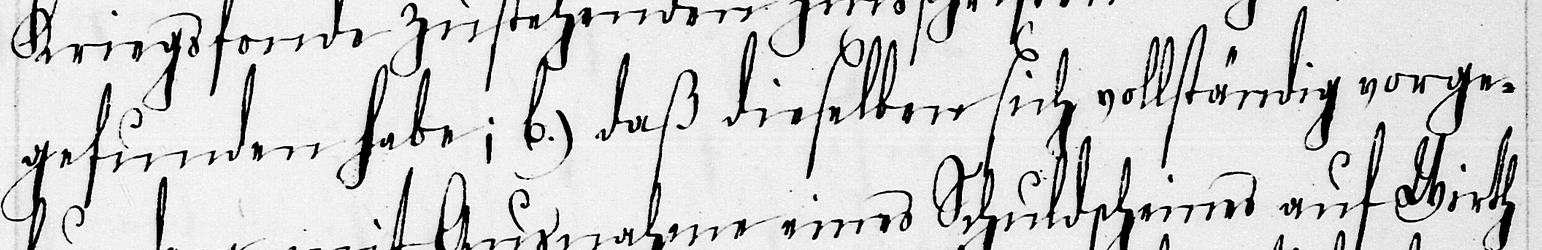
gefunden habe; b.) daß dieselben sich vollständig vorge¬
